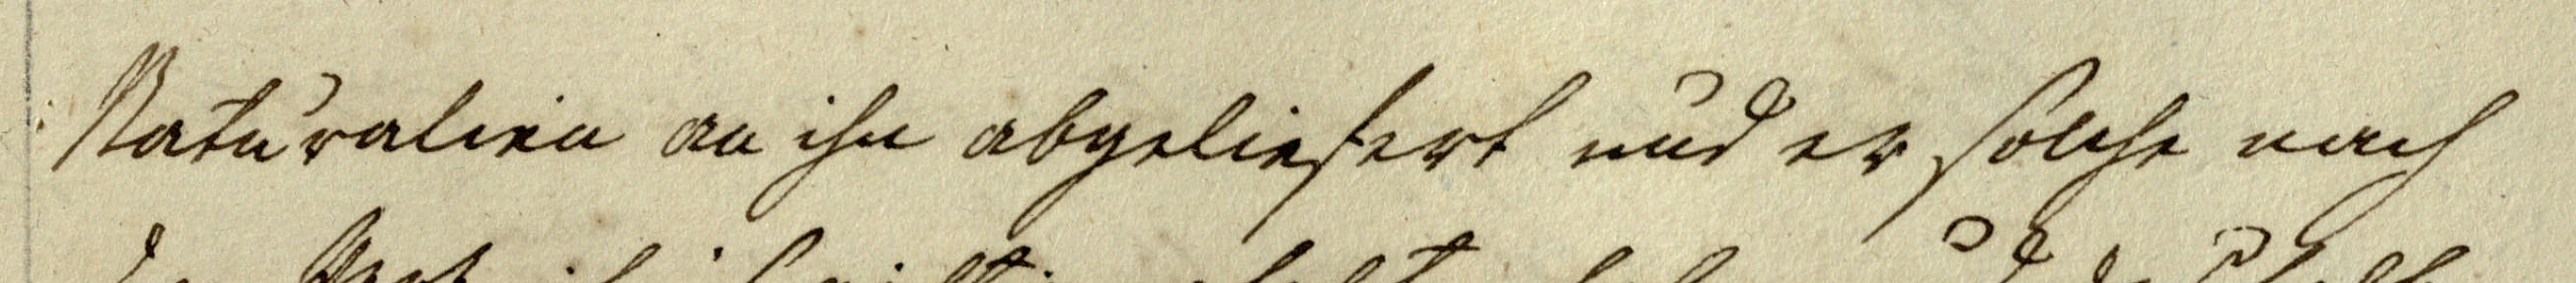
Naturalien an ihn abgeliefert und er solche nach
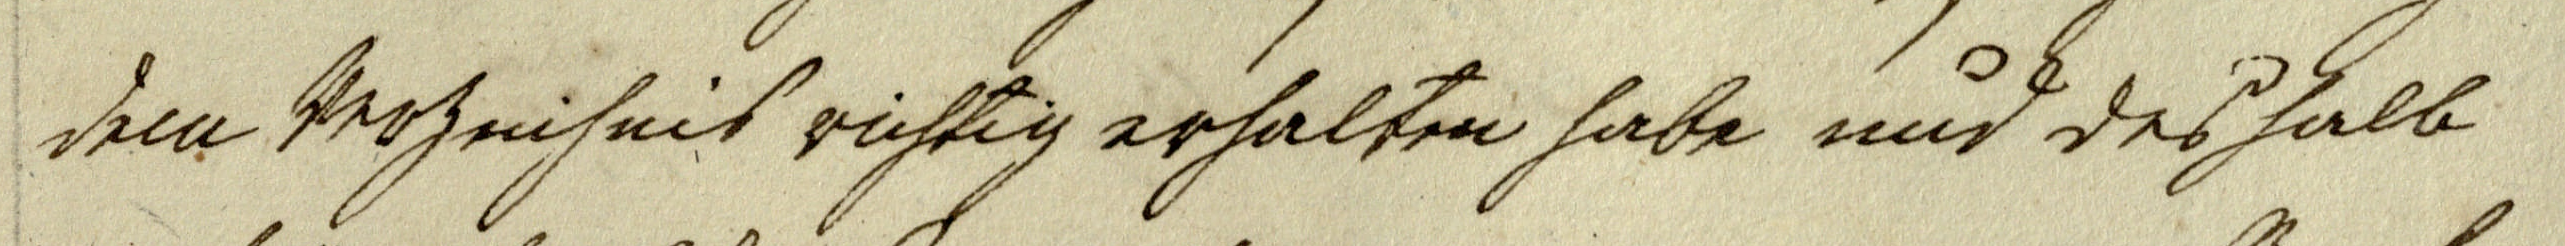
dem Verzeichnis richtig erhalten habe und deshalb
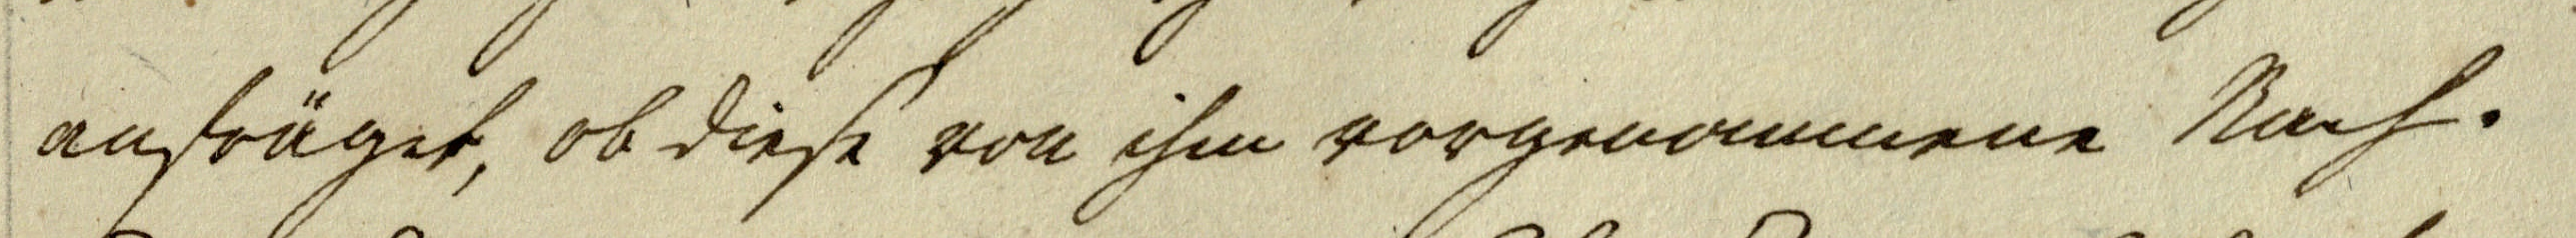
anfräget, ob diese von ihm vorgenommene Nach¬
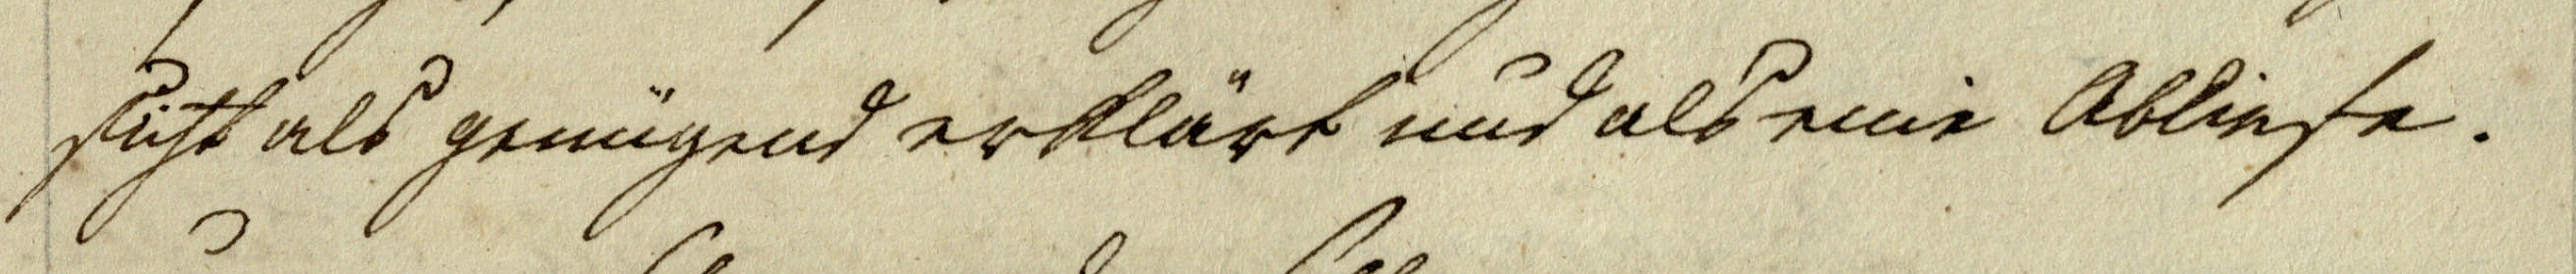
sicht als genügend erklärt und als eine Abliefe¬
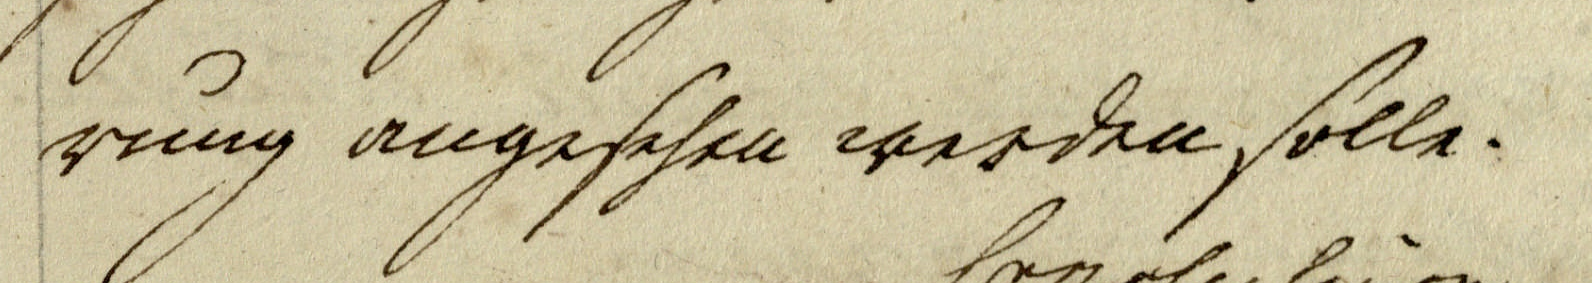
rung angesehen werden solle.
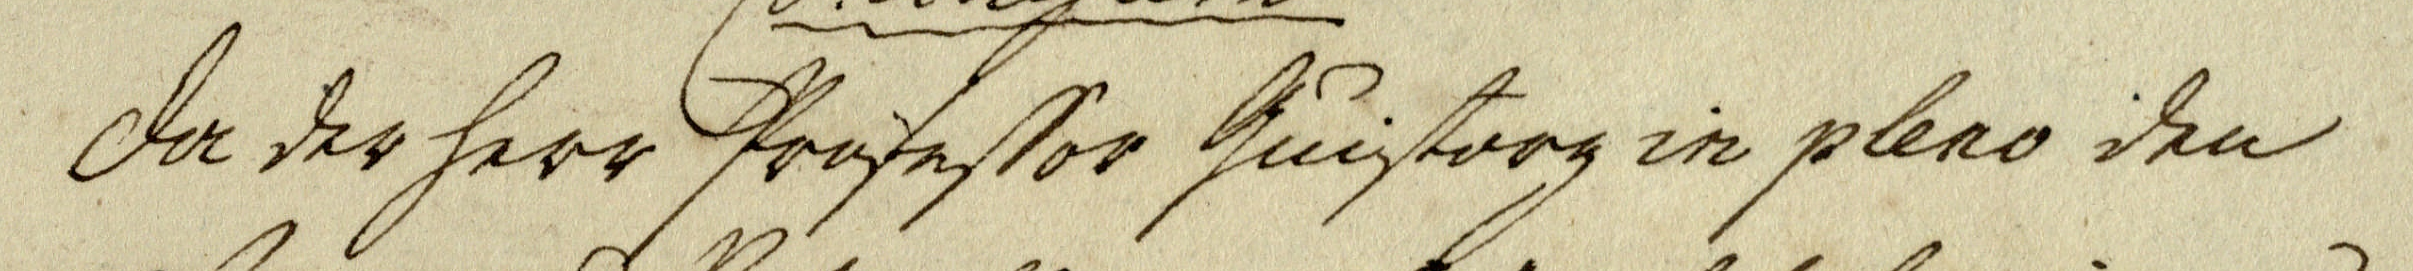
Da der Herr Professor Quistorp in pleno den
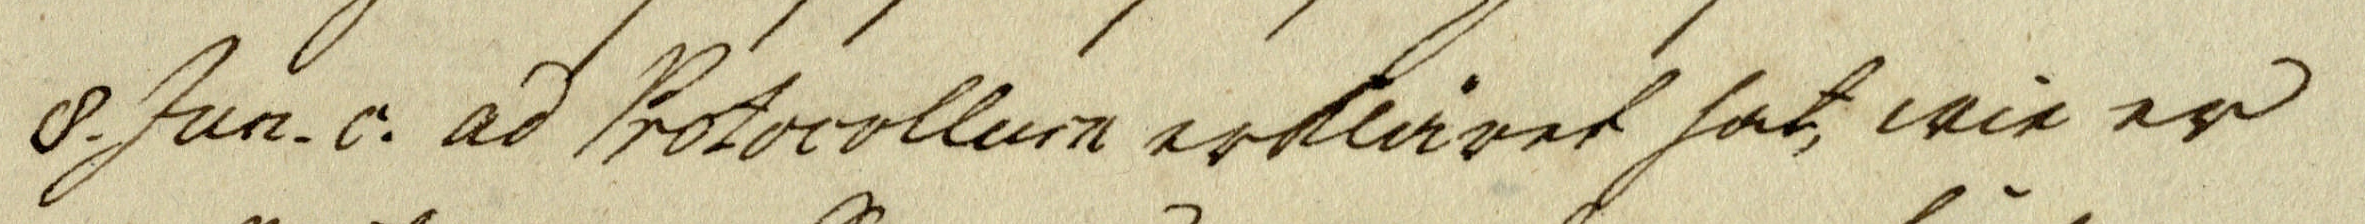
8. Jun. c. ad Protocollum erkläret hat, wie er
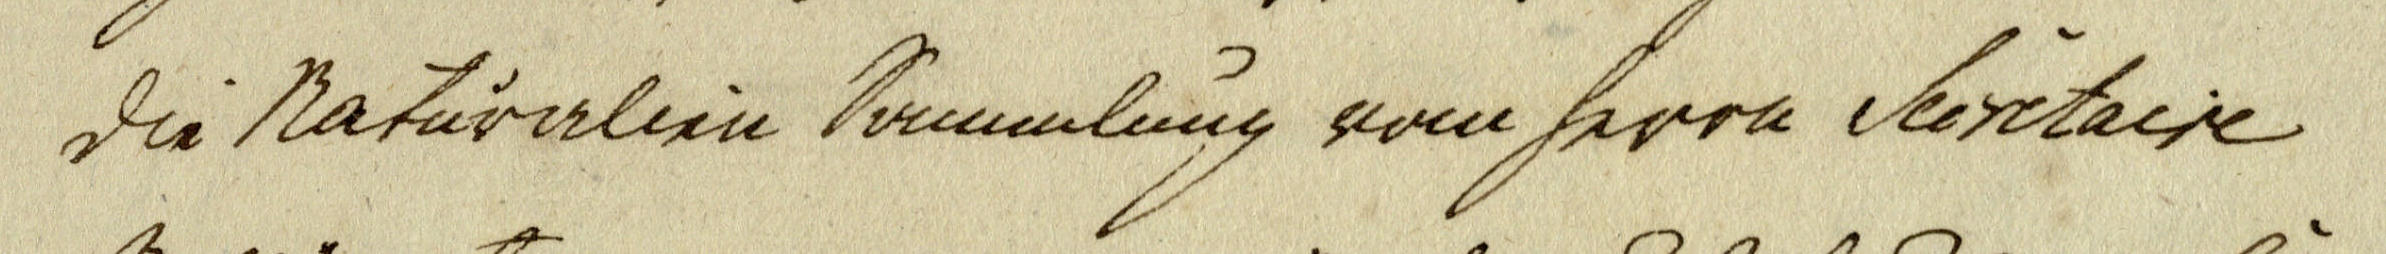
die Naturalien Sammlung vom Herrn Secretaire
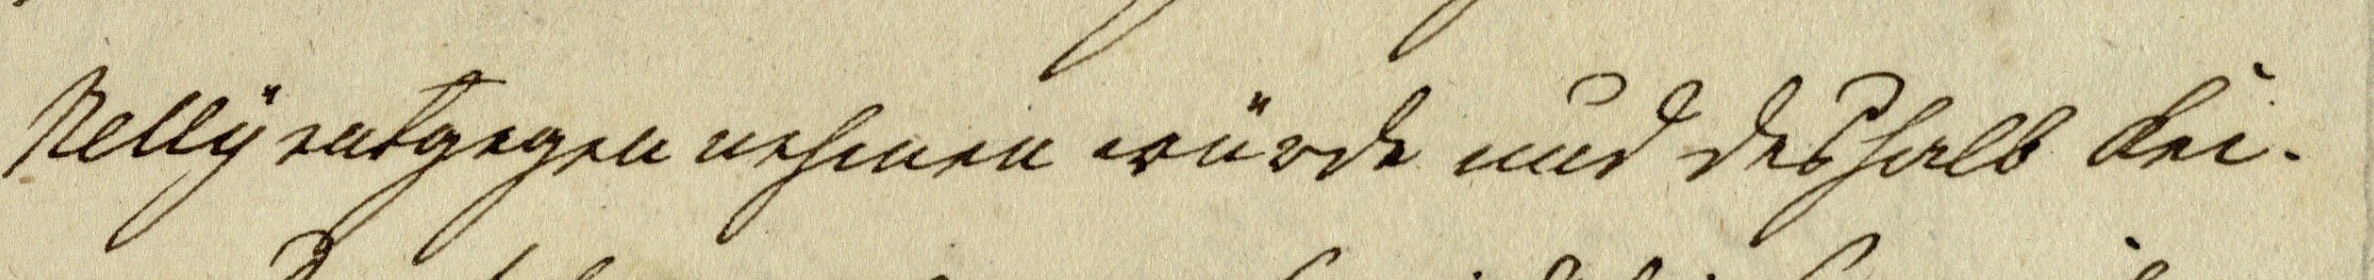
Nellÿ entgegen nehmen würde und deshalb kei¬
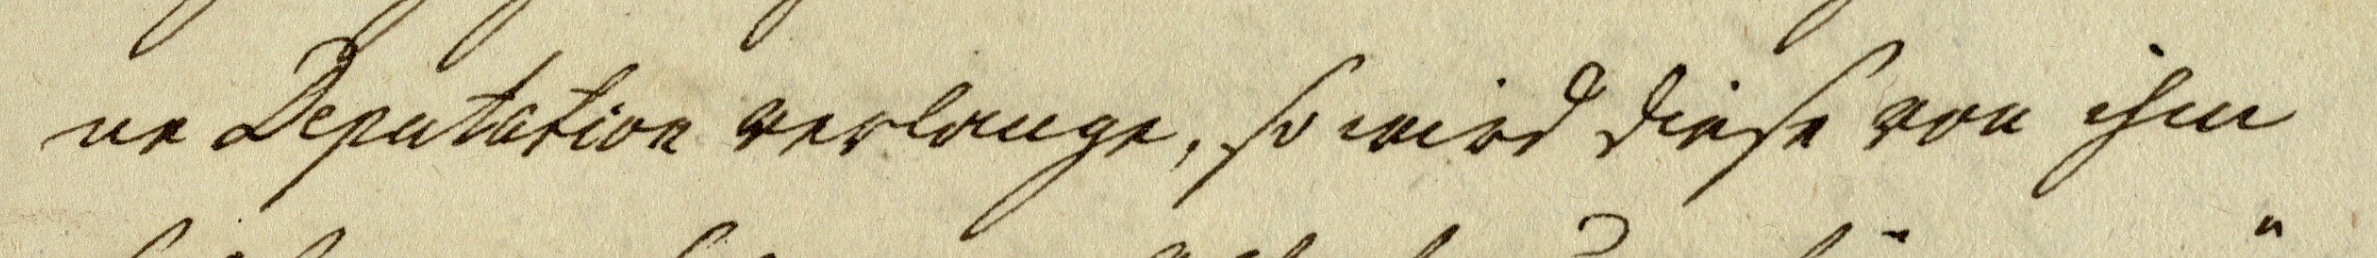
ne Deputation verlange, so wird diese von ihm
